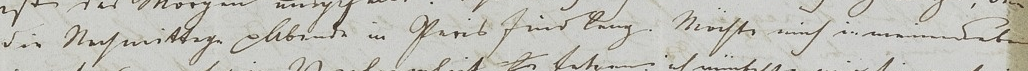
die Nachmittage & Abende in Paris sind lang. Möchte mich in meinem Leben
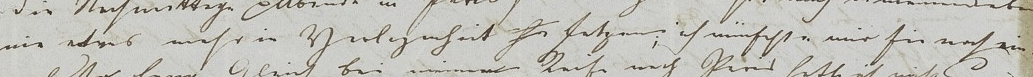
nie etwas mehr in Verlegenheit h... setzen; ich wünschte mir sie noch ein-
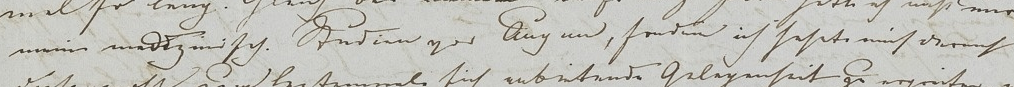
meine medizinisch. Studien vor Augen, sondern ich sehnte mich darnach
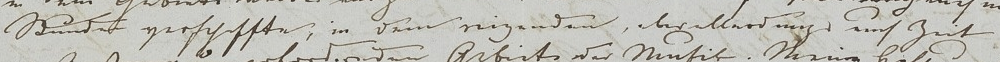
Stunden verschaffte, in dem reizenden, aber allerdings auch Zeit
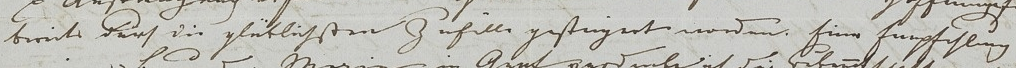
bereits durch die glüklichsten Zufälle gesteigert worden. Einer Empfehlung
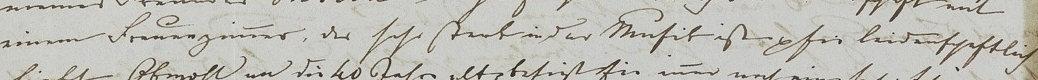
einem Frauenzimmer, das sehr stark in der Musik ist & sie leidenschaftlich
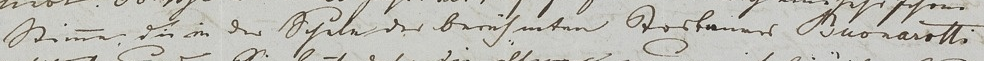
Stimme, die in der Schule des berühmten ToskanersBuonarotti
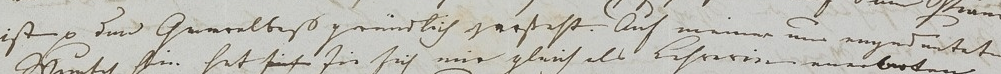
ist & den Generalbaß gründlich versteht. Auf meinen nur angedeuteten
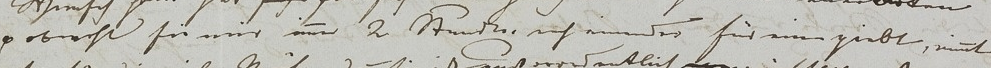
& obwohl sie mir immer 2 Stunden nach einander für eine giebt, nimmt
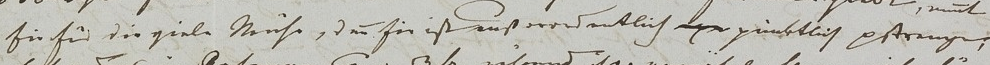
sie für die viele Mühe, denn sie ist außerordentlich ... pünktlich & strenge,
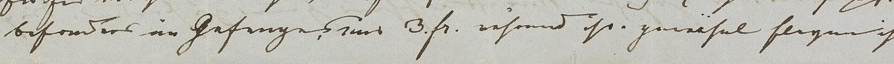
besonders im Gesange, nur 3 fr. während ihre gewöhnl Eleven ihr
